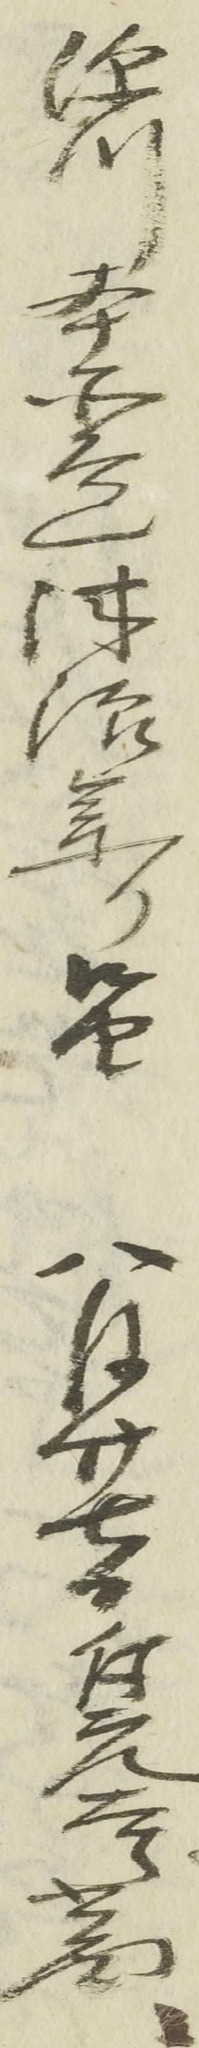深川本所辺津浪参り候由八月廿七日付元太郎書面
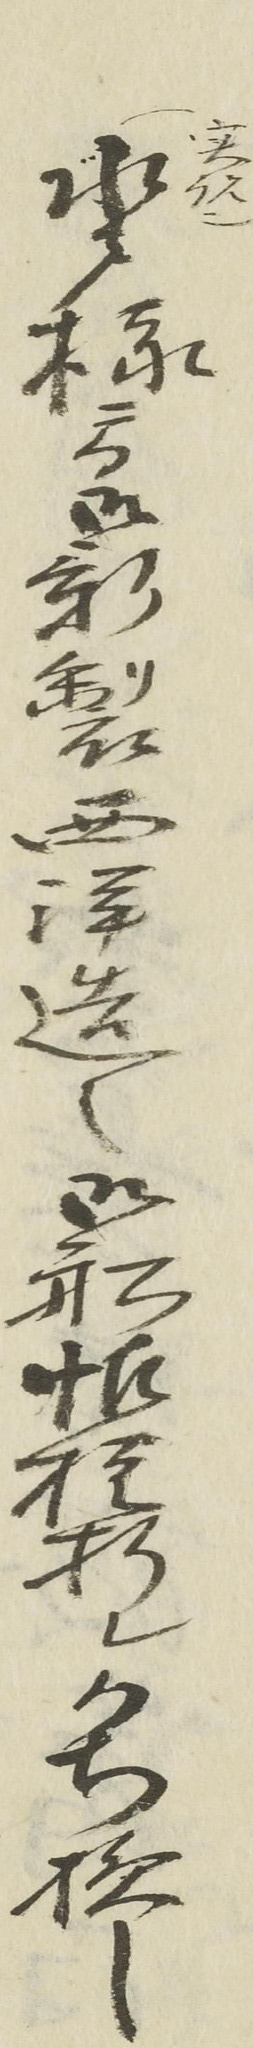一水戸様ニハ御新製西洋造之御船帆柱折レクち損し
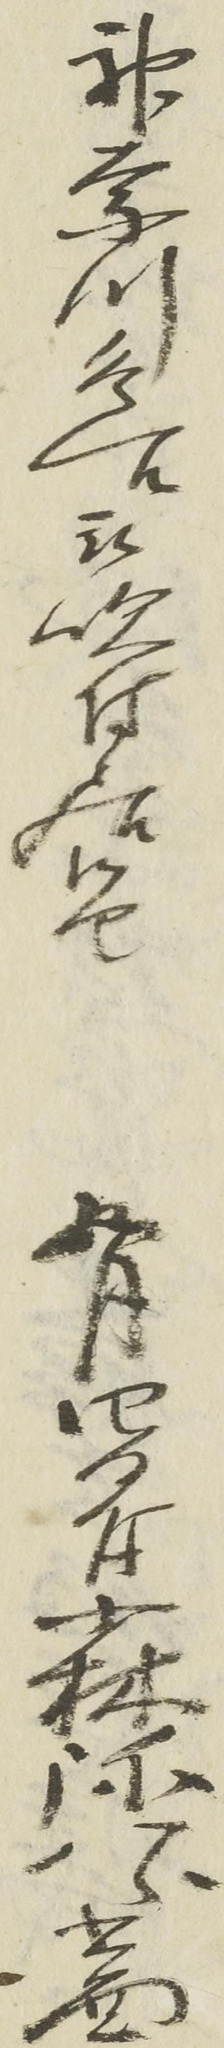神奈川辺江被吹付居候由九月四日付小林弥八郎書面
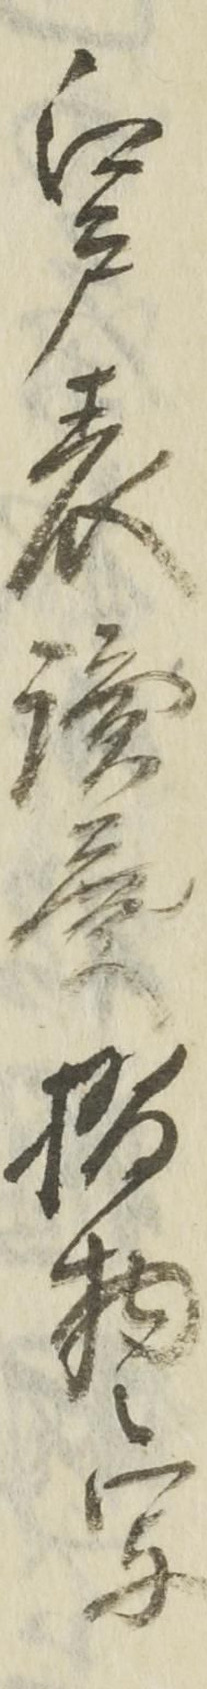江戸表読売摺物之写
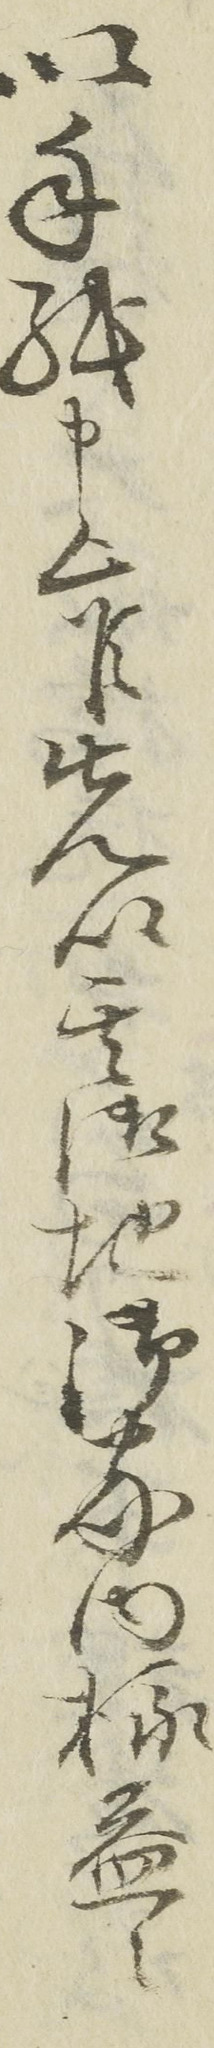以手紙申上候先以其御地御家内様益々
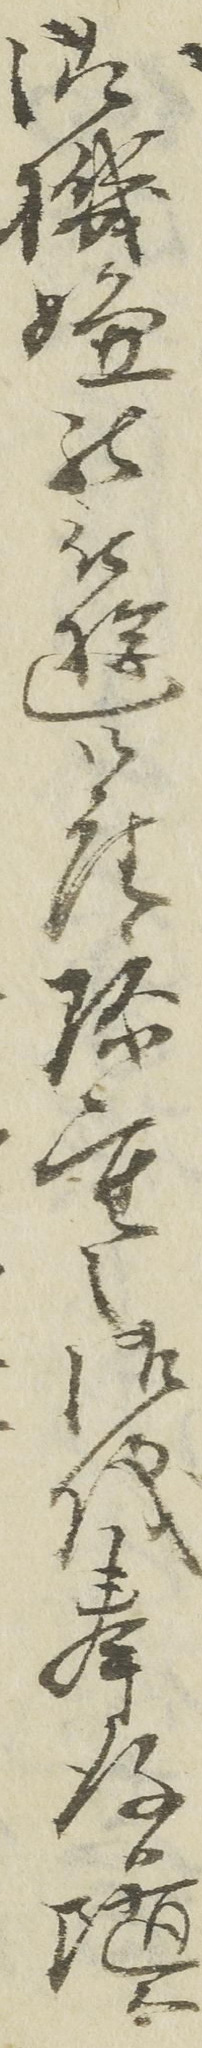御機嫌能被遊御座候珍重之御儀奉存候随而
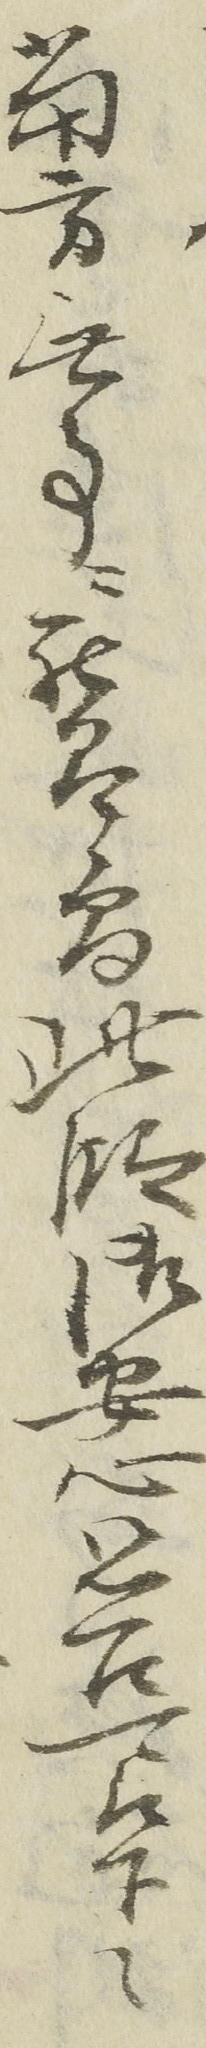当方無事ニ罷尽候間此段御安心思召可被下候
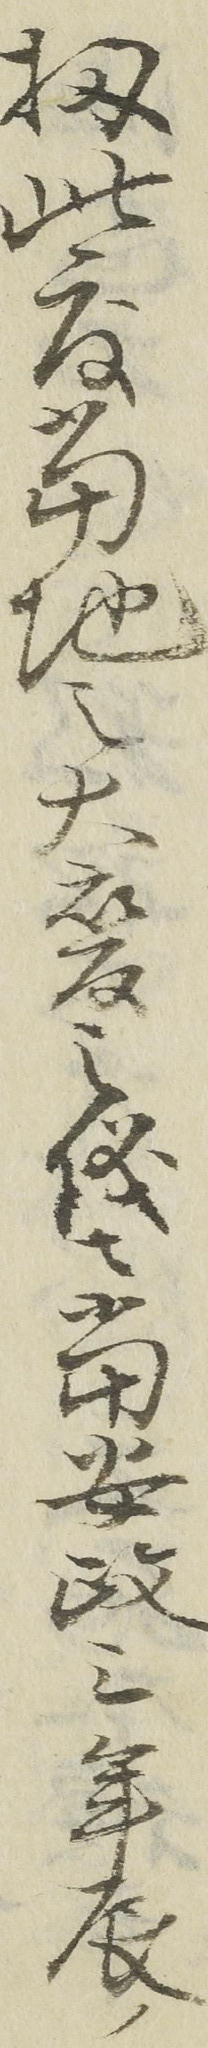扨此度当地之大変之儀は当安政三年辰ノ
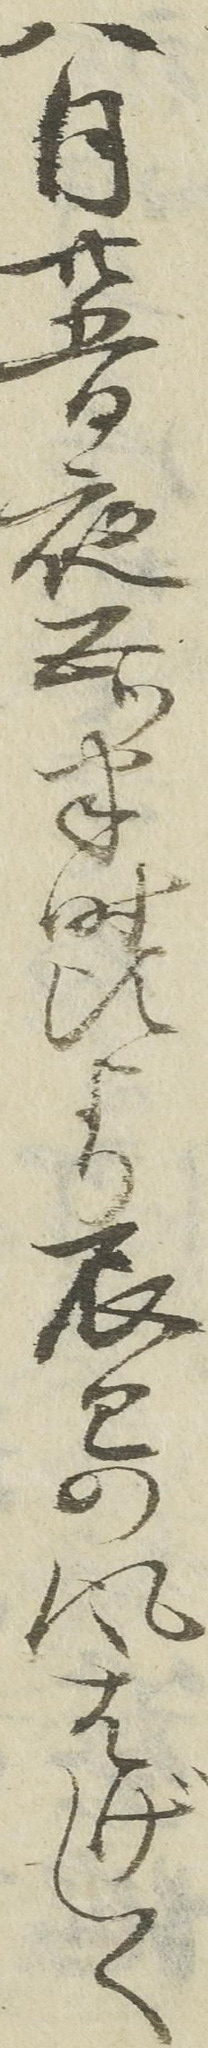八月廿五日夜五ツ半時比より辰巳の風はげしく
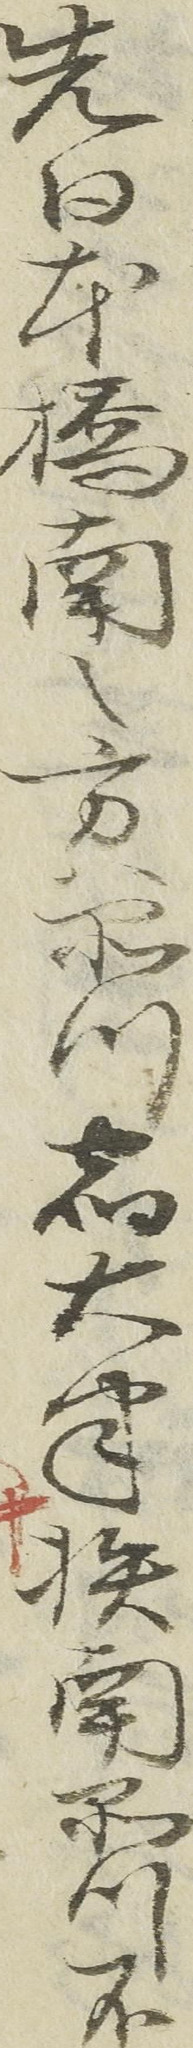先日本橋南之方ハ品川宿大半損南品川不
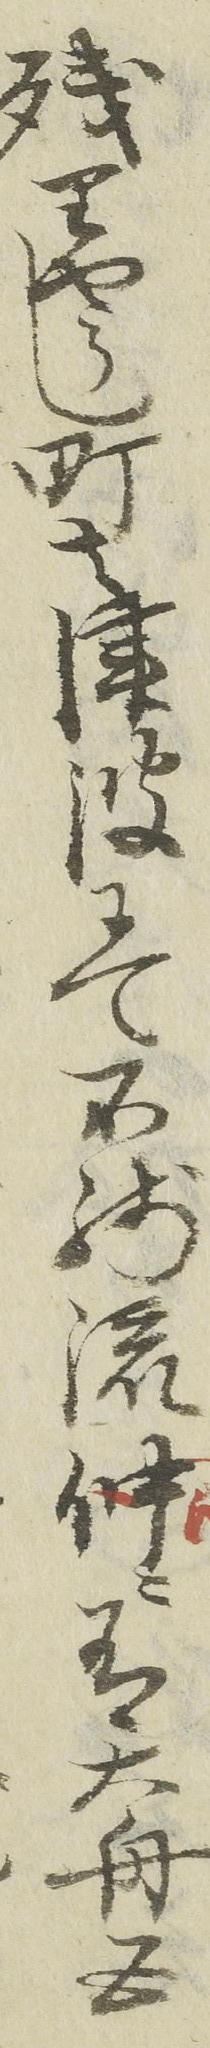残りやうし町は津波にて不残流仲ニ有候大舟五
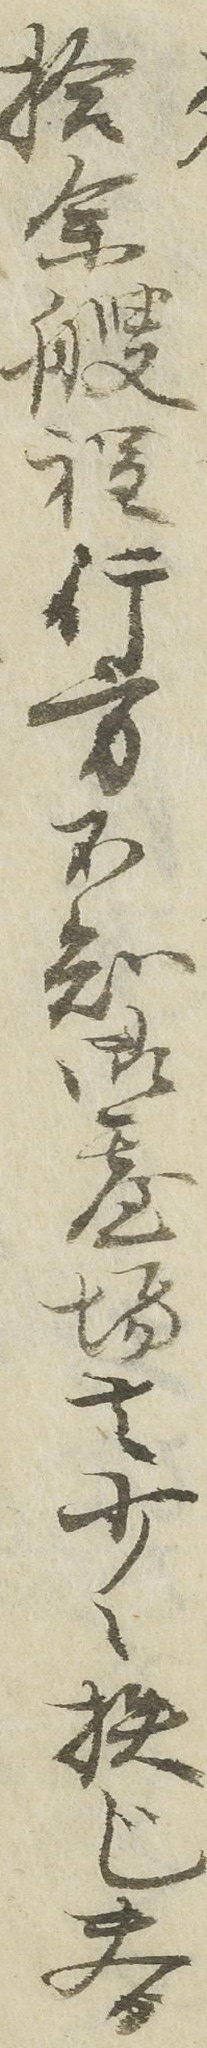拾余艘程行方不知御台場は少し損じ夫ゟ
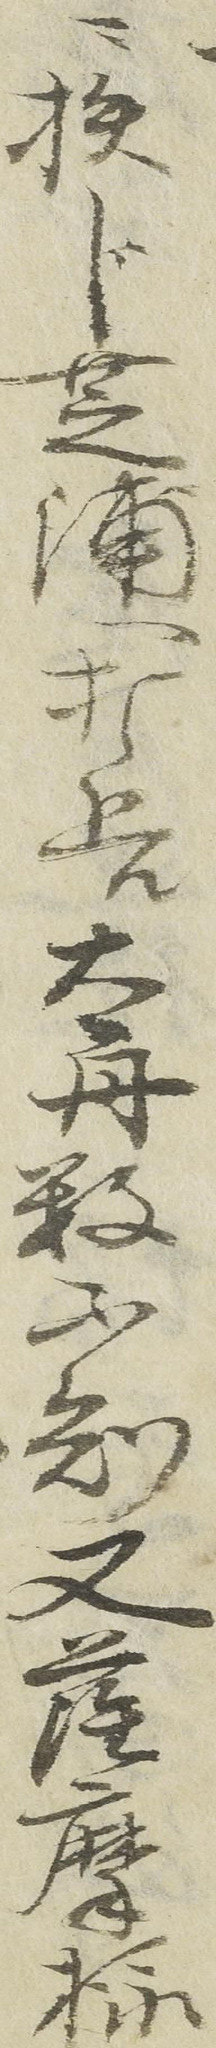ニ損じ芝浦へ打上ル大舟数不知又薩摩様
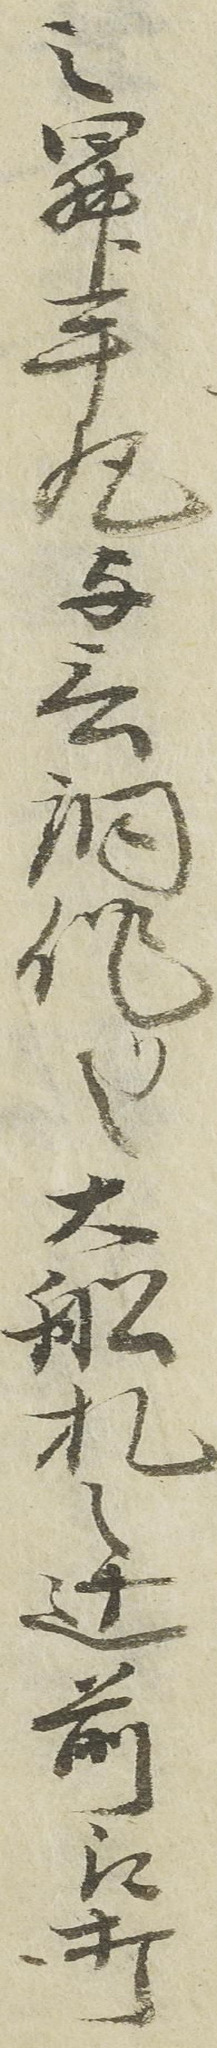之昇平丸と云銅作り之大船札之辻前江打

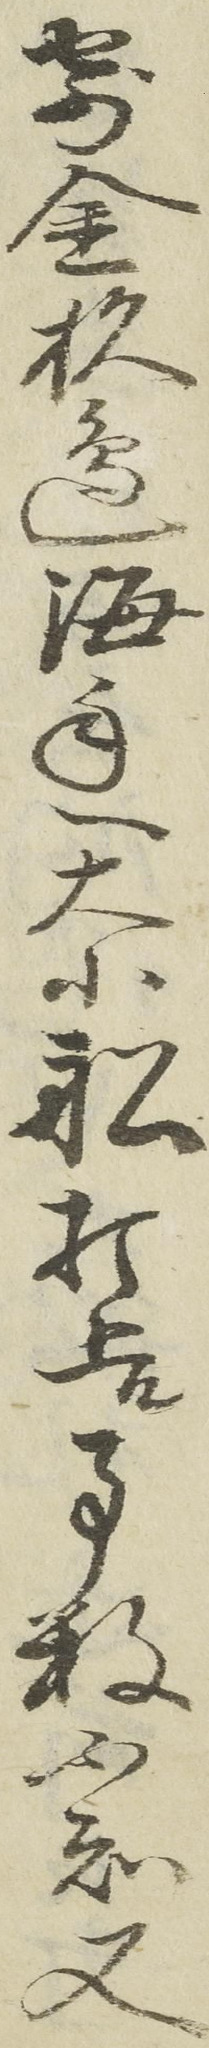寄金杉辺海手へ大小船打上ル事数不知又
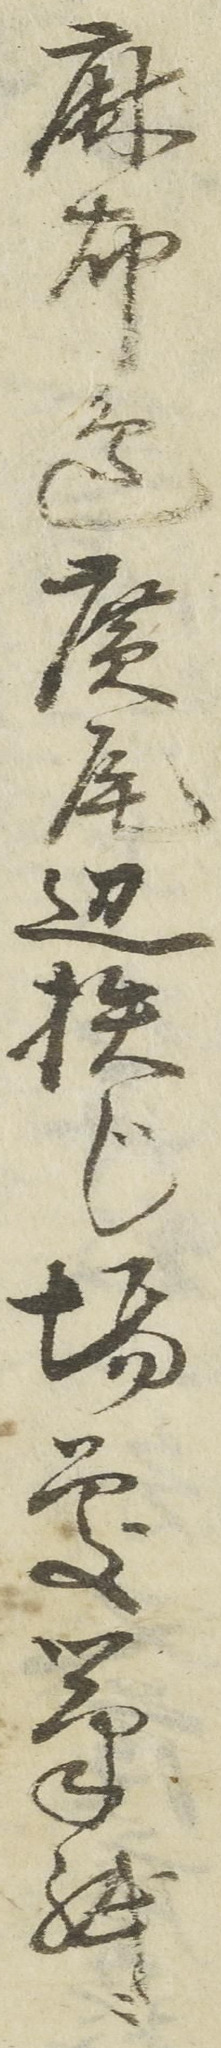麻布辺広尾辺損じ場処筆紙ニ
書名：安政乙卯江戸大地震筆記　安政丙辰八月大阪大雷雨之記追加　安政三辰年七月松前辺大地震并八月大風雨記録
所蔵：東京大学地震研究所図書室 Earthquake Research Institute Library, The University of Tokyo, JAPAN
